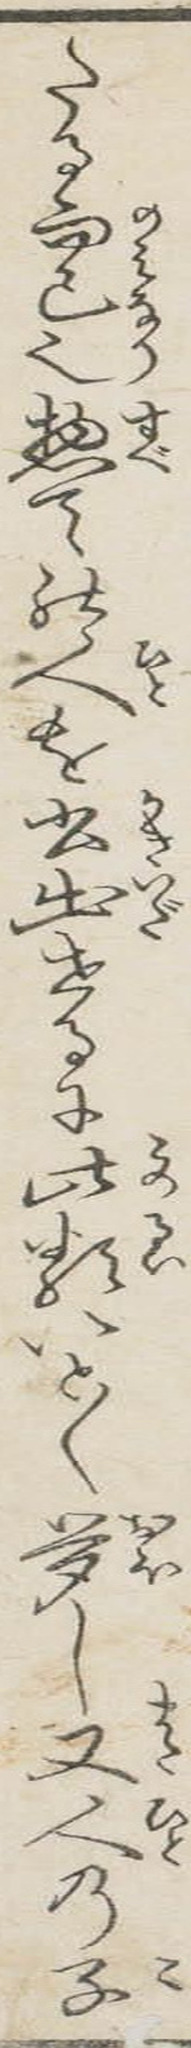たる而已也総ての人を書出せるに此類いと〳〵多し又人の子
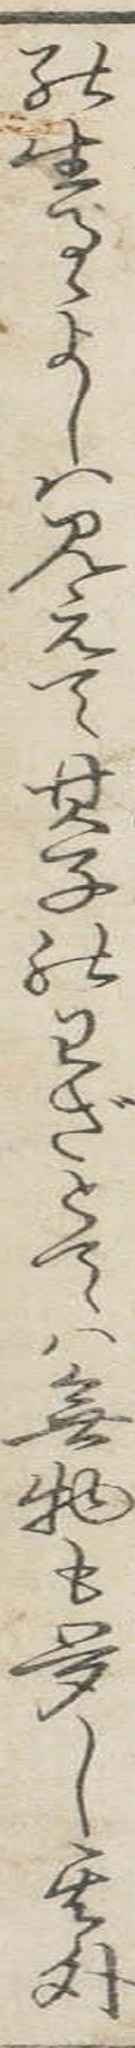の生るゝよしは見えて其子のわざとては無物も多し其外

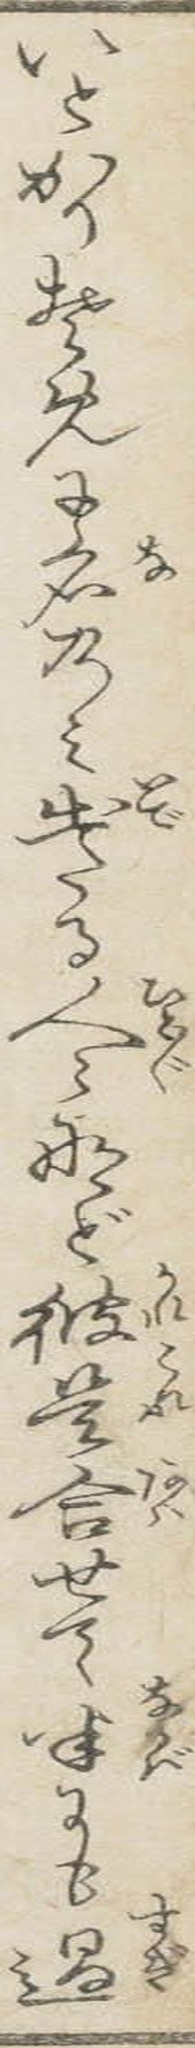いとかりそめに名のみ出たる人々など彼是合せて半にも過
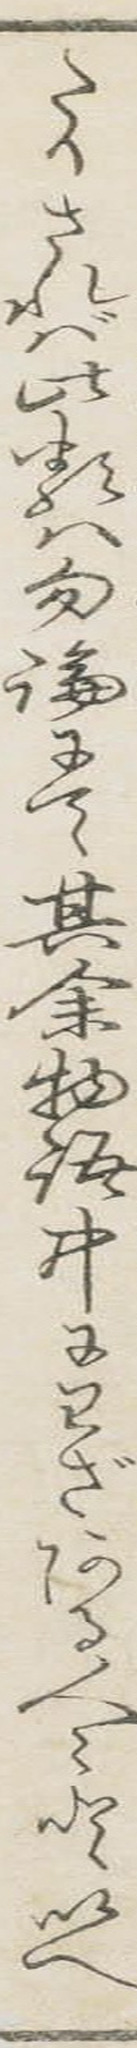たりされば此類は勿論にて其余物語中にわざある人々といへ
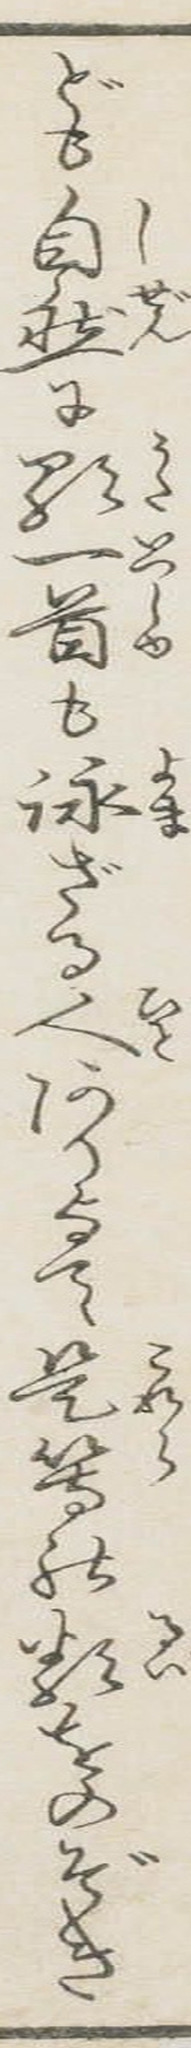ども自然に歌一首も詠ざる人ありとて是等の類をのぞき
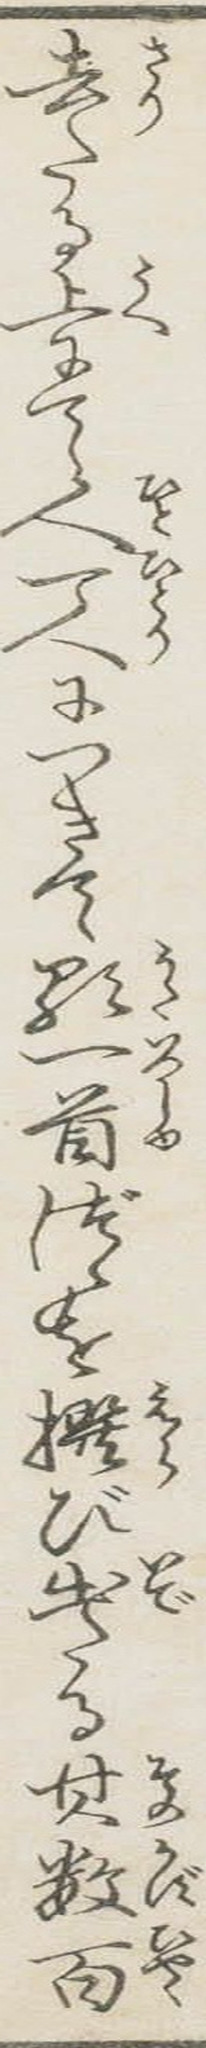去たる上にて人一人につきて歌一首づゝを撰び出たる其数百
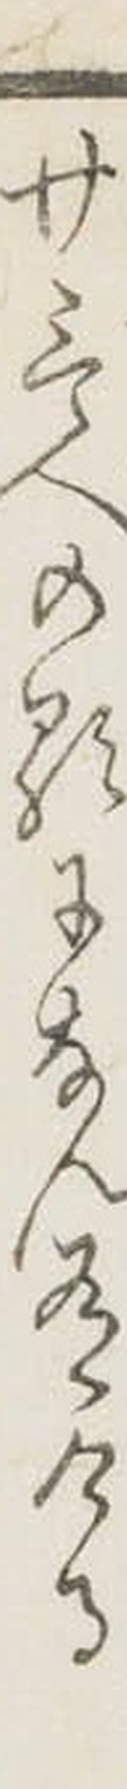廿三人の歌になん有ける
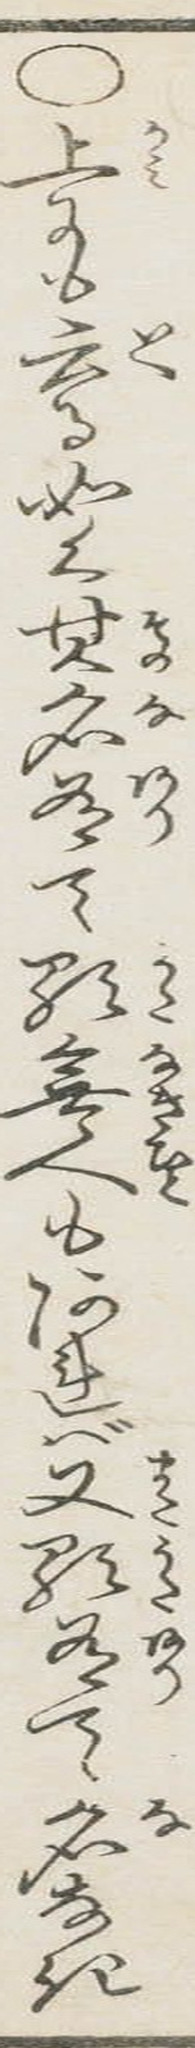○上にも云る如く其名有て歌無人もあれば又歌有て名なき
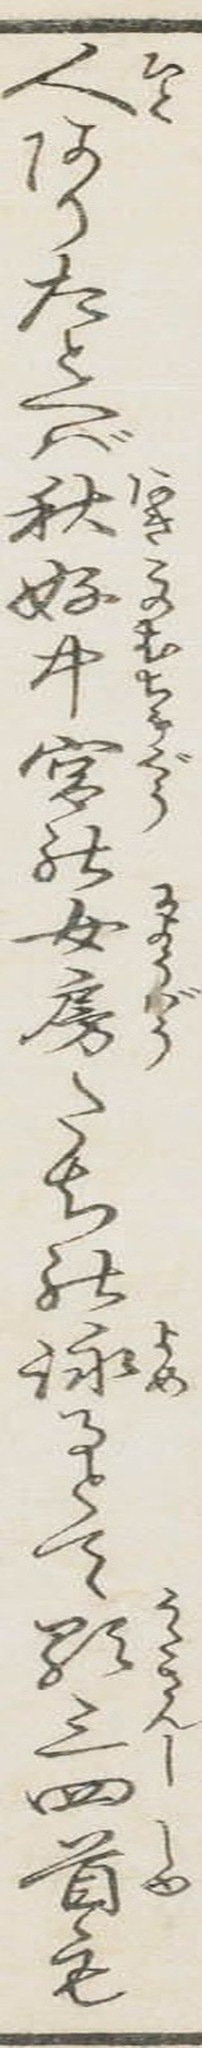人ありたとへば秋好中宮の女房たちの詠るとて歌三四首も
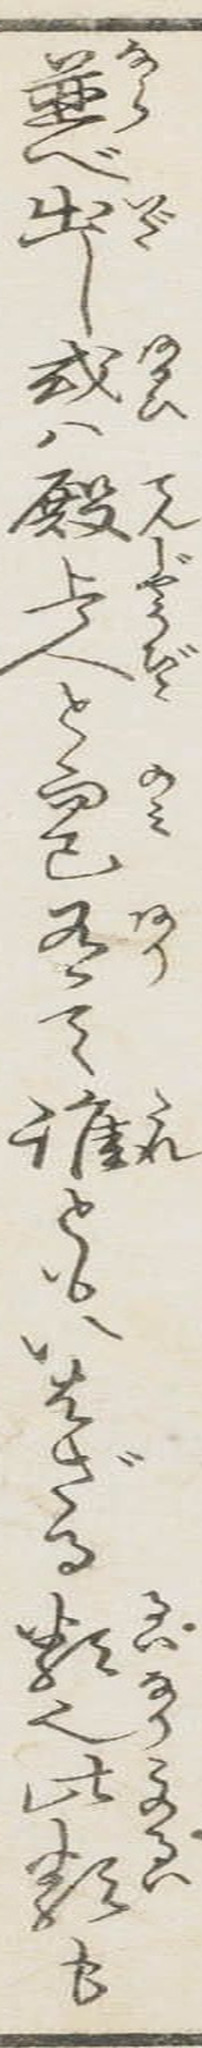並べ出し或は殿上人と而已有て誰ともいはざる類也此類も
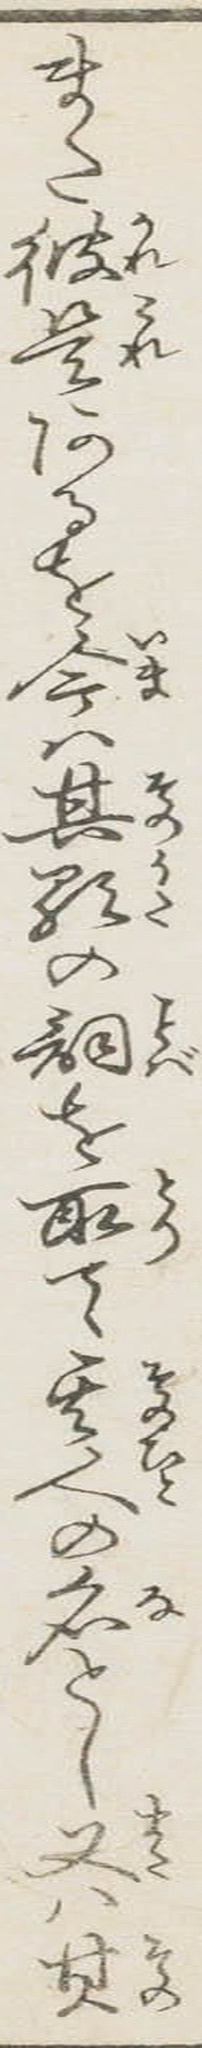また彼是あるを今は其歌の詞を取て其人の名とし又は其
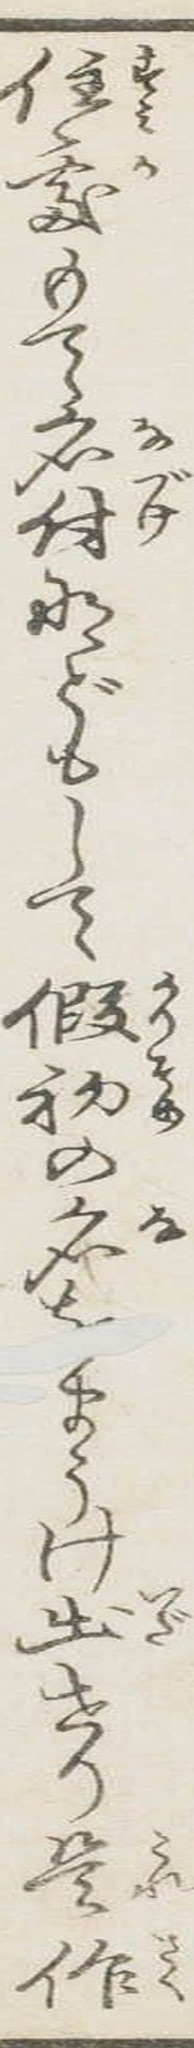住処もて名付などもして仮初の名をまうけ出せり是作
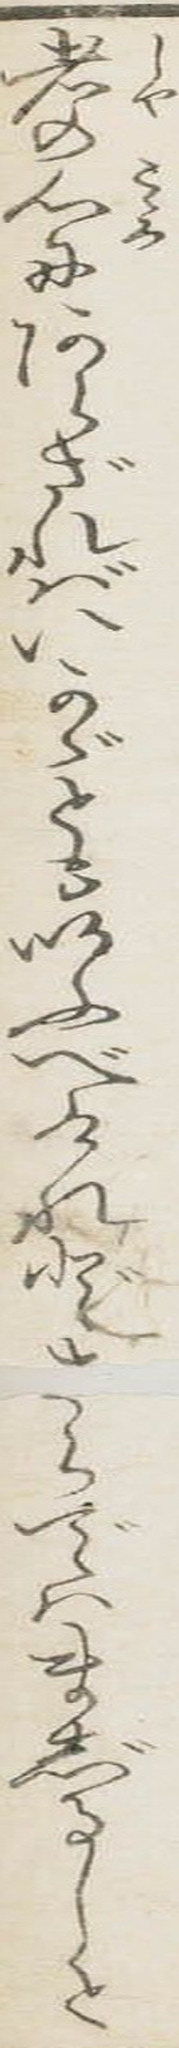者の心にあらざればいかゞともいふべけれどさらではまじるしと
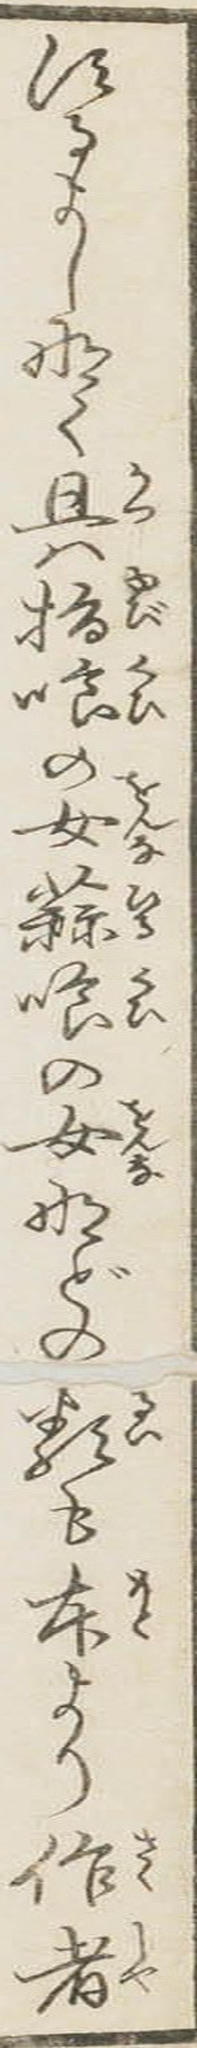するよしなく且は指喰の女蒜喰の女などの類も本より作者
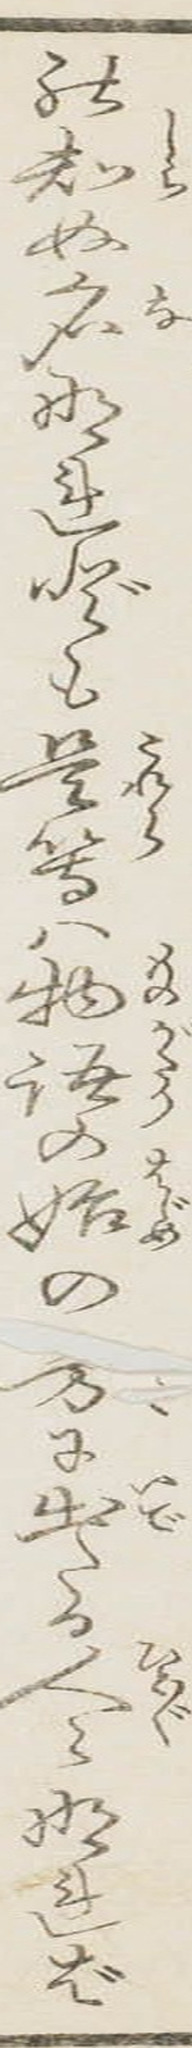の知ぬ名なれども是等は物語の始の方に出たる人々なれば
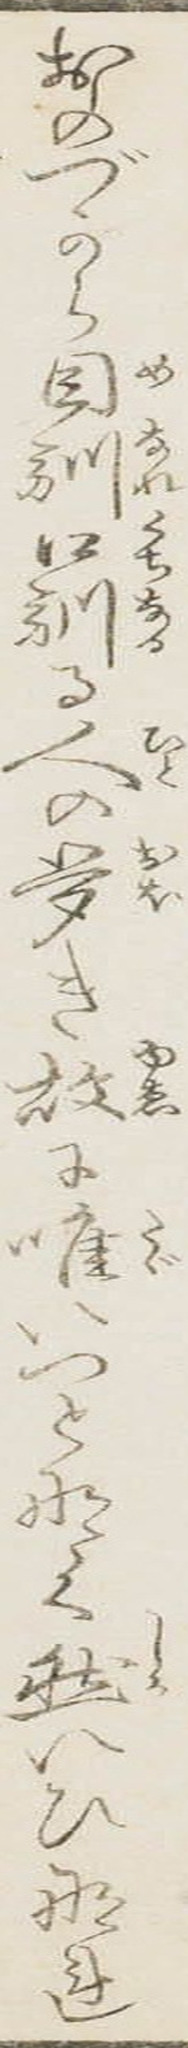おのづから目馴口馴る人の多き故に唯いつとなく然いひなれ
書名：源氏百人一首
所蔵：東京学芸大学教育コンテンツアーカイブ
